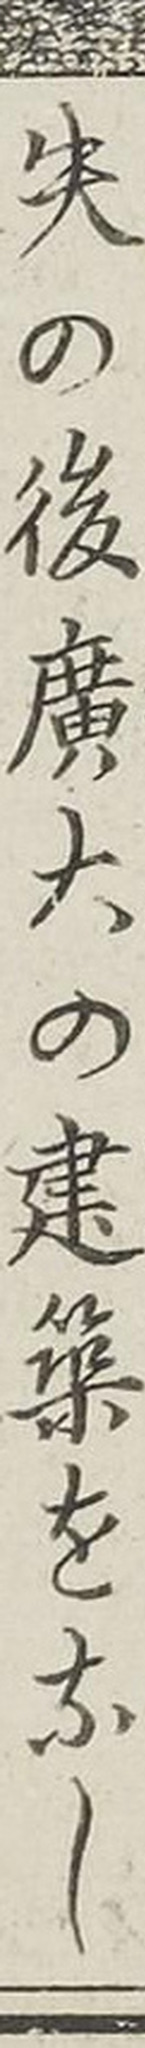失の後廣大の建築をなし
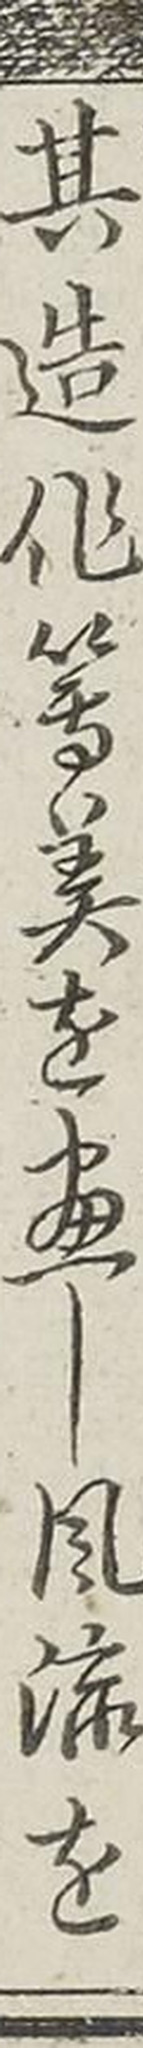其造作等美を盡し風流を
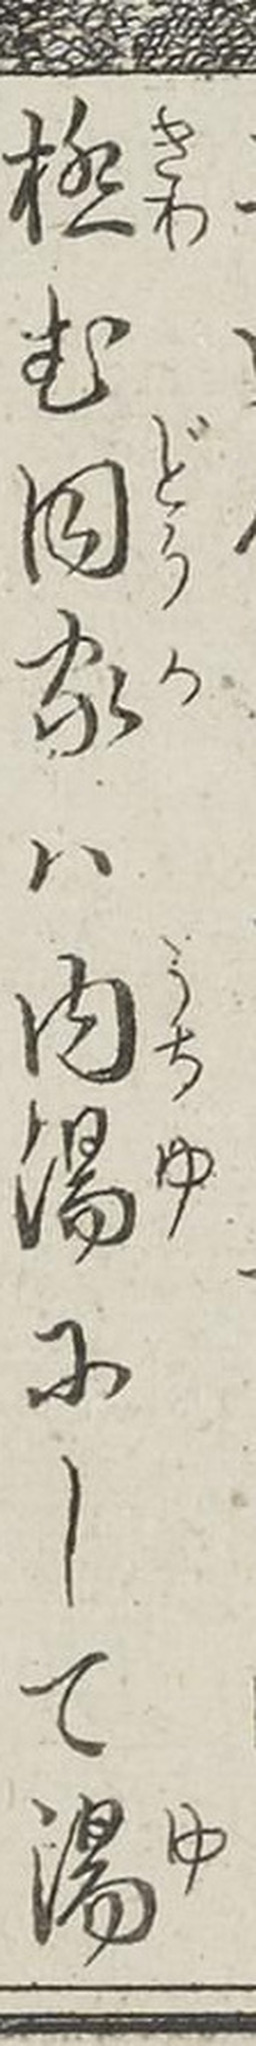極む同家は内湯にして湯
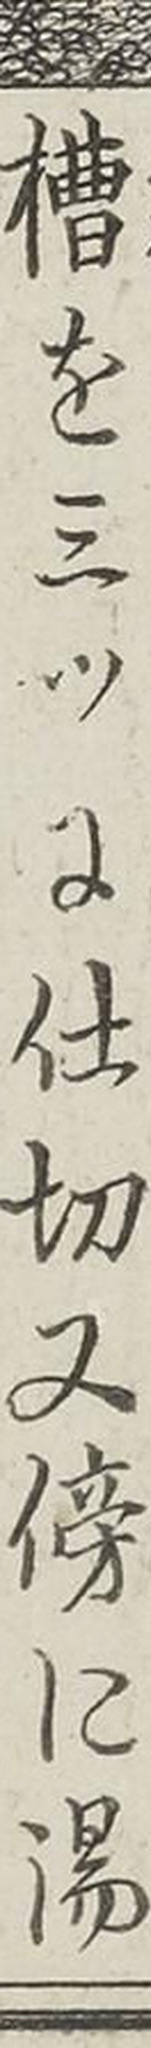槽を三ッに仕切又傍に湯
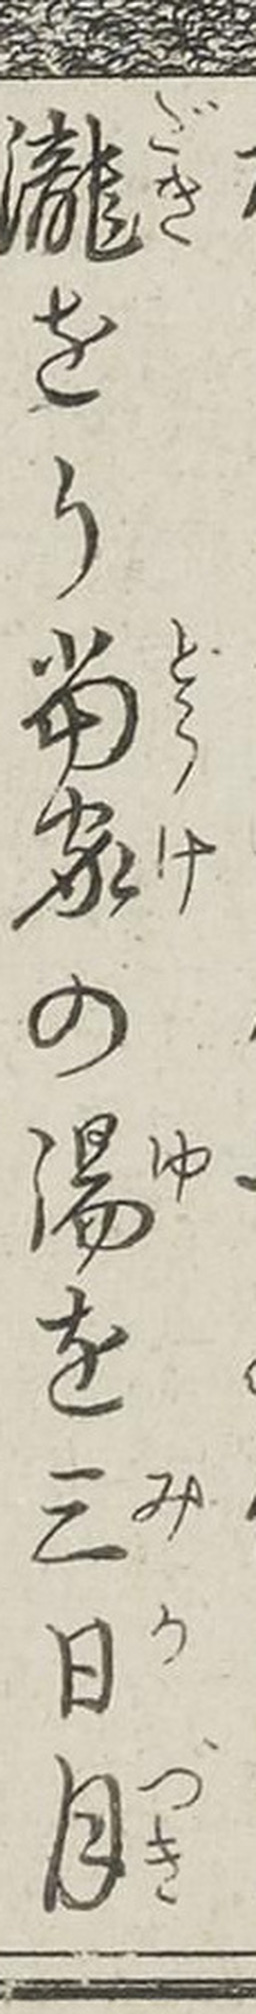瀧をり当家の湯を三日月
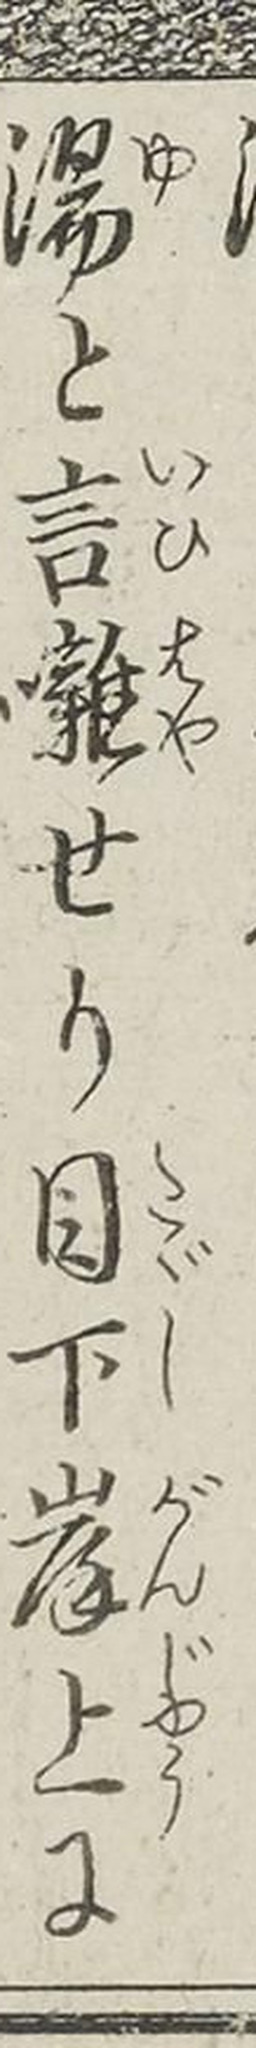湯と言囃せり目下岩上に
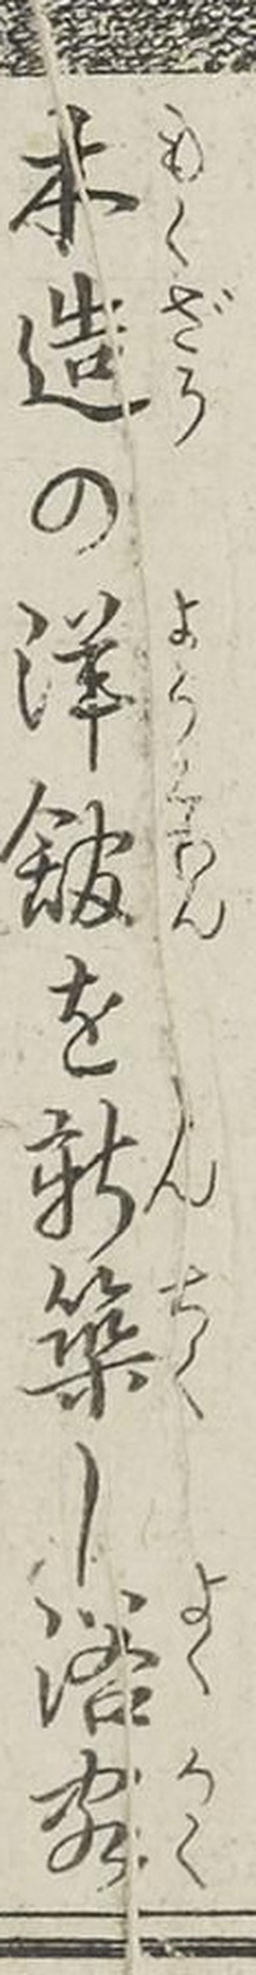木造の洋館を新築し浴客
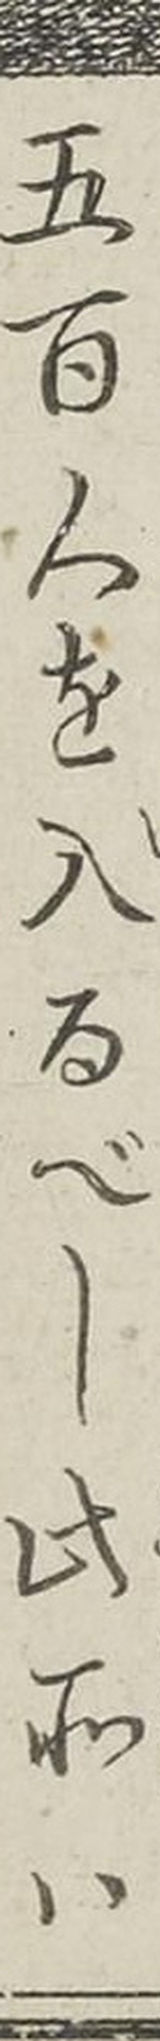五百人を入るべし此所は

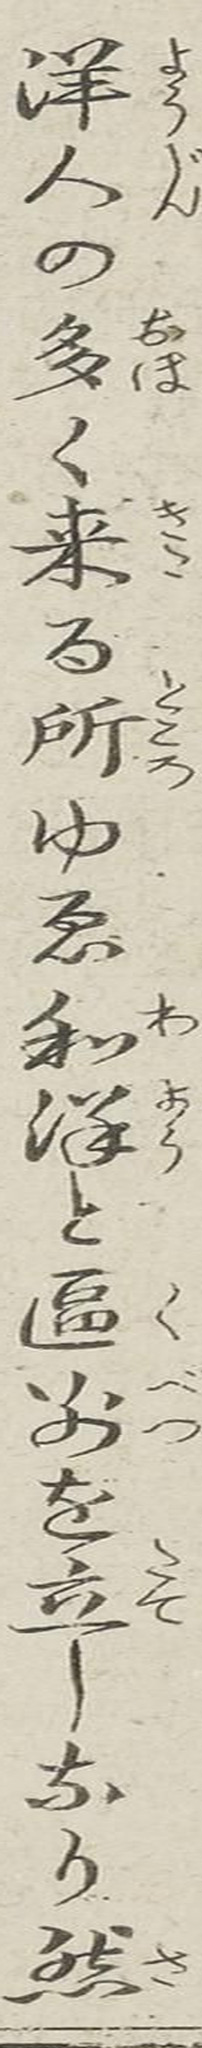洋人の多く来る所ゆゑ和洋と区別を立しなり然
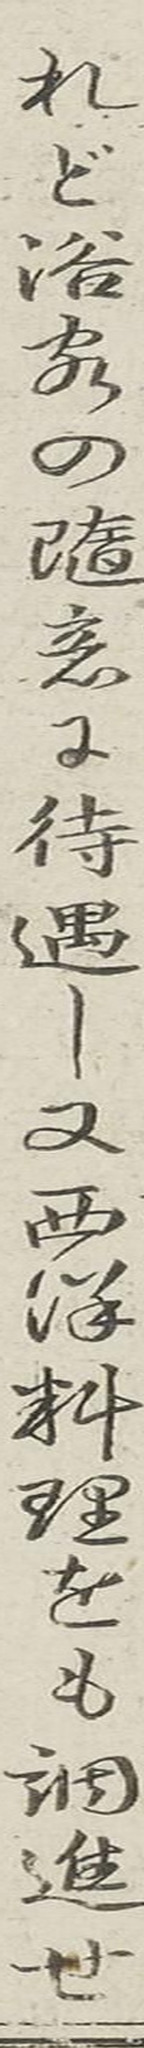れど浴客の随意に待遇し又西洋料理をも調進せ
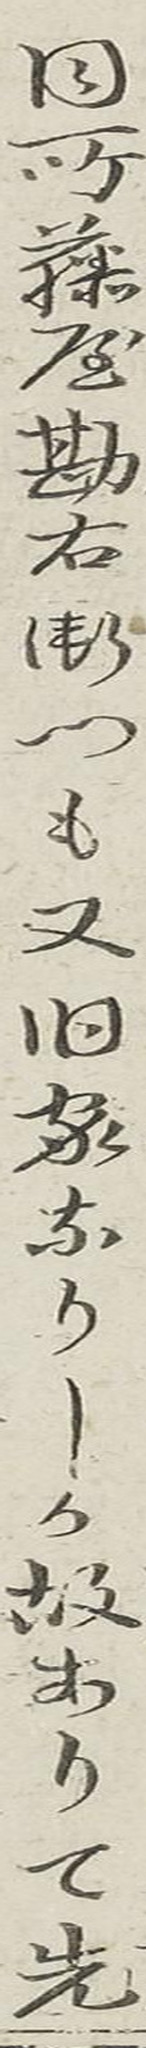同所藤屋勘右衛門も又旧家なりしか故ありて先
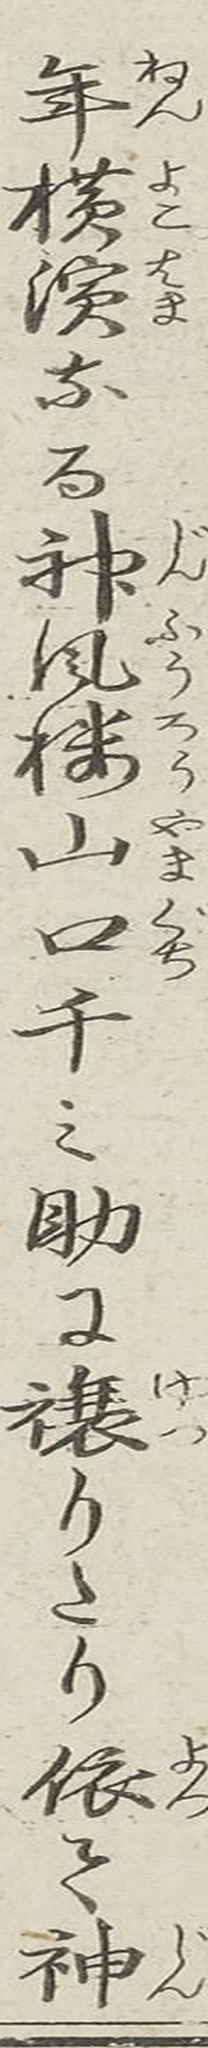年横浜なる神風楼山口千之助に譲りたり依て神
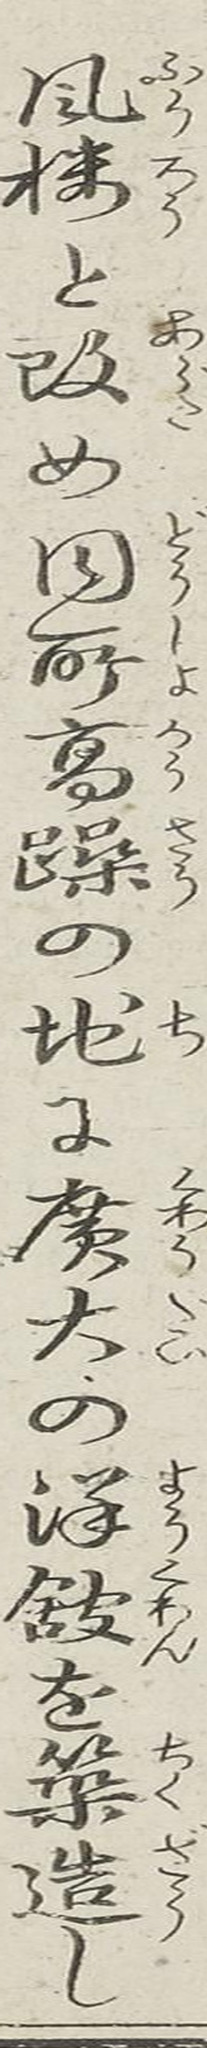風楼と改め同所高躁の地に廣大の洋館を築造し
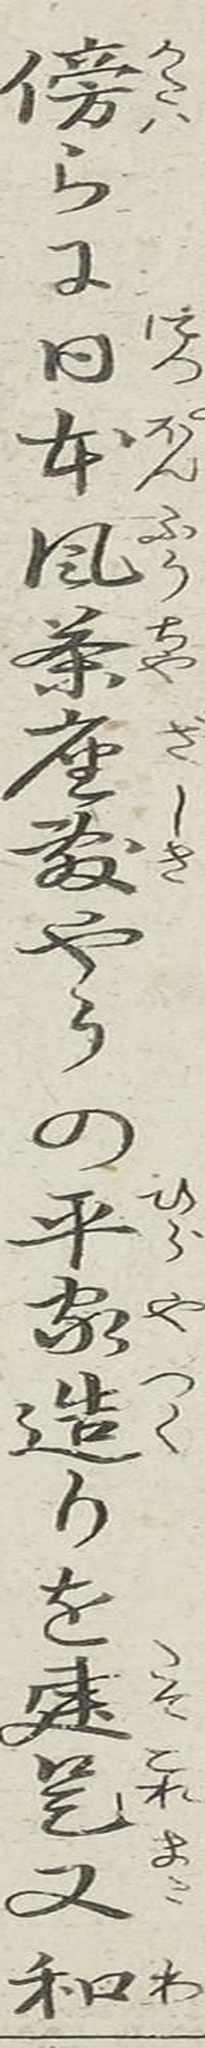傍らに日本風茶座敷やうの平家造りを建是又和
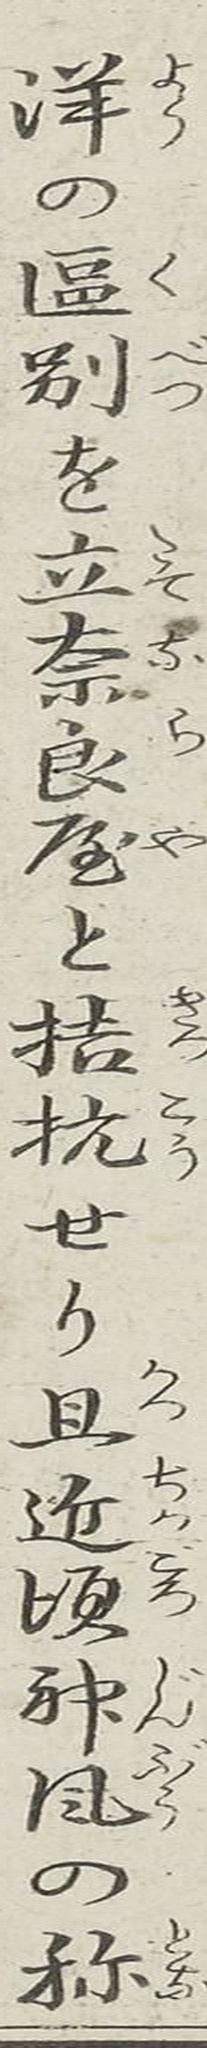洋の区別を立奈良屋と拮抗せり且近頃神風の称
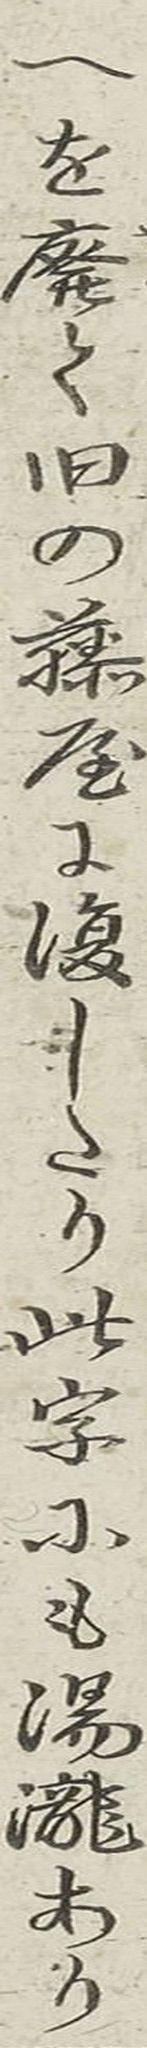へを廃て旧の藤屋に復したり此字にも湯瀧あり
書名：箱根温泉誌　全
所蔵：東京大学地震研究所図書室 Earthquake Research Institute Library, The University of Tokyo, JAPAN
